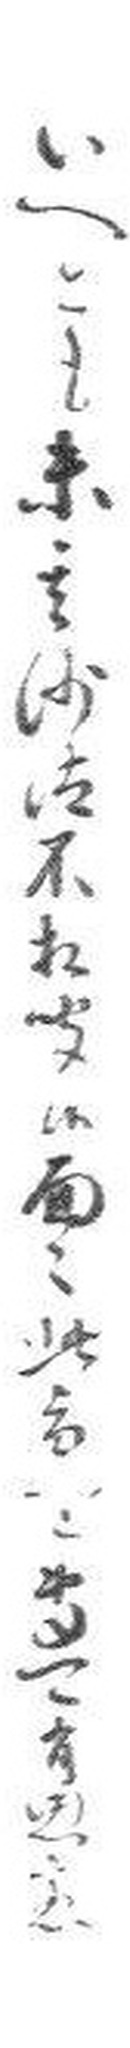いへとも未其沙汰不相聞候面々此旨を専可有思慮
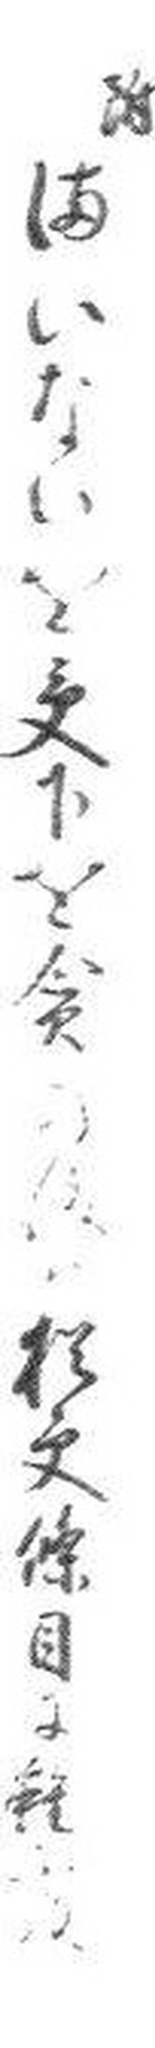附まいないを受下を貪の儀ハ猶更条目に雖不及
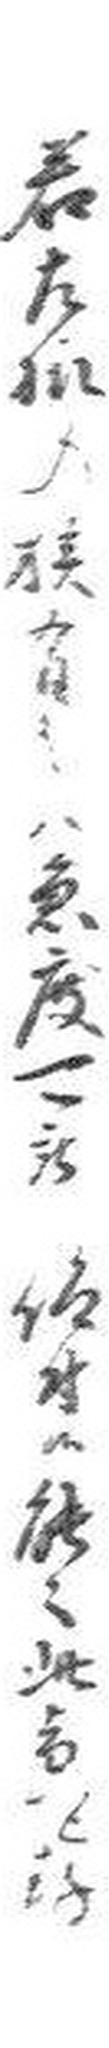若左様の族有之ハ急度可被仰付候能々此旨を存
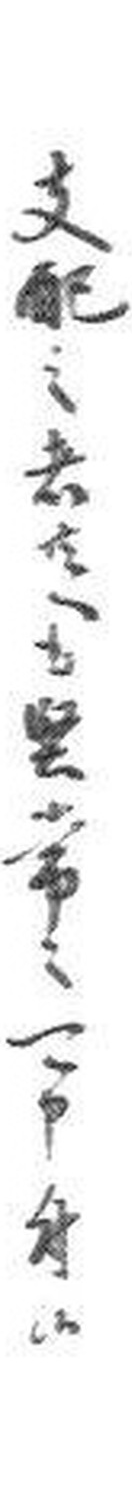支配の者共へも堅常々可申付候

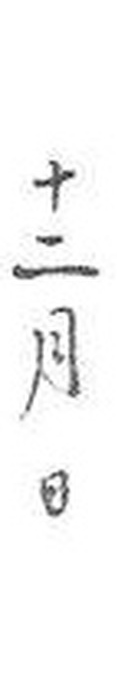十二月日
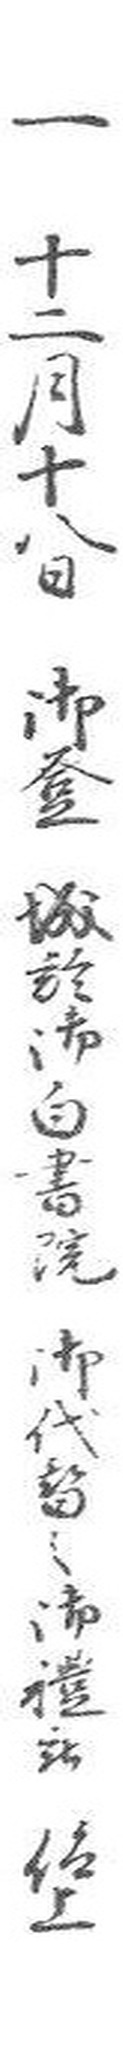一十二月十八日御登城於御白書院御代替之御礼被仰上
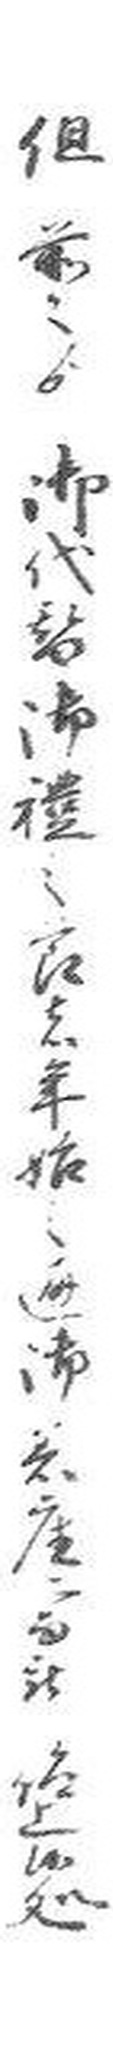但前々ゟ御代替御礼之節者年始之通御着座ニ而被仰上
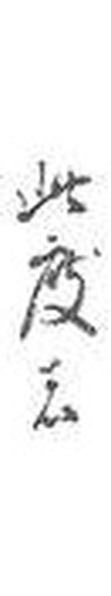此度者
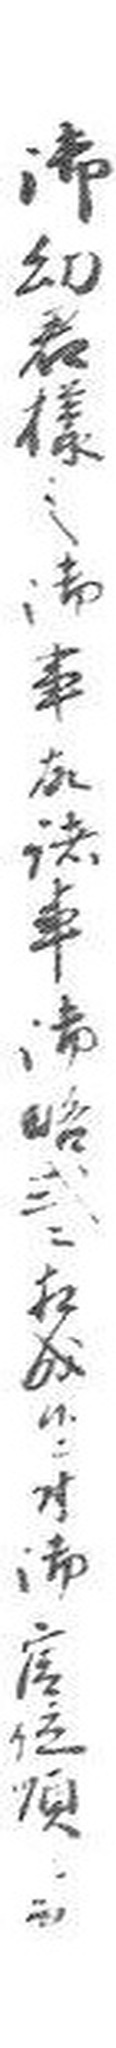御幼君様之御事故諸事御略式ニ相成候ニ付御官位頂
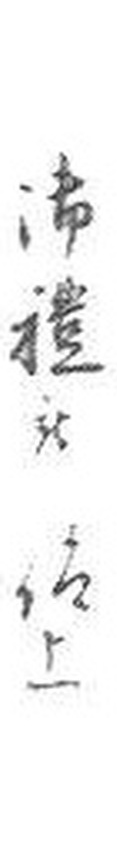御礼被仰上
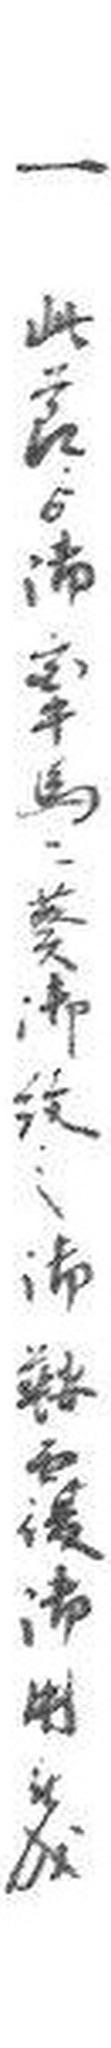一此節ゟ御牽馬ニ葵御紋之御鞍覆御用被成
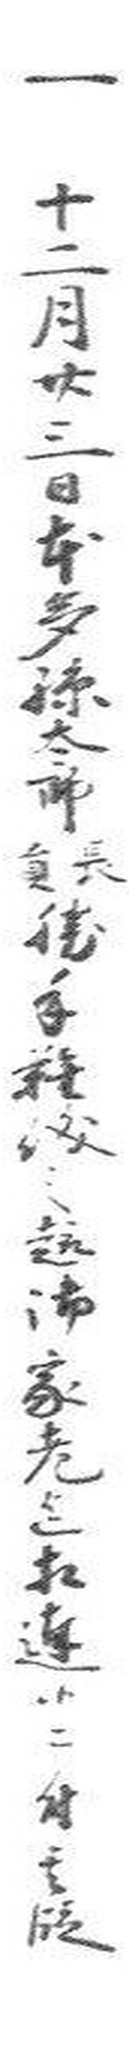一十二月廿三日本多孫太郎長員勝手難義之趣御家老迄相達候ニ付其
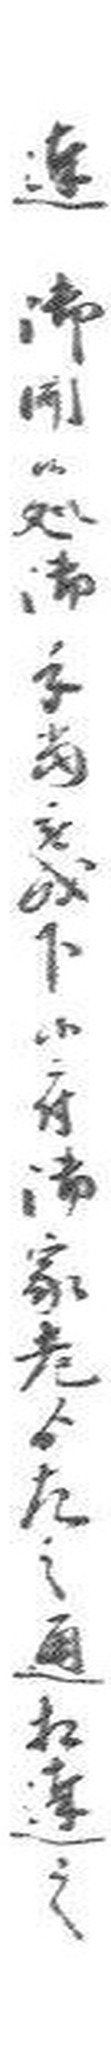達御聞候処御手当被成下候ニ付御家老ゟ左之通相達之
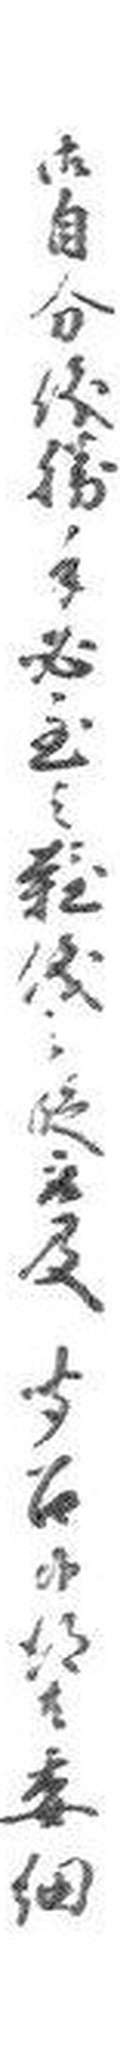御自分儀勝手必至之難義之段被及聞召候得共委細
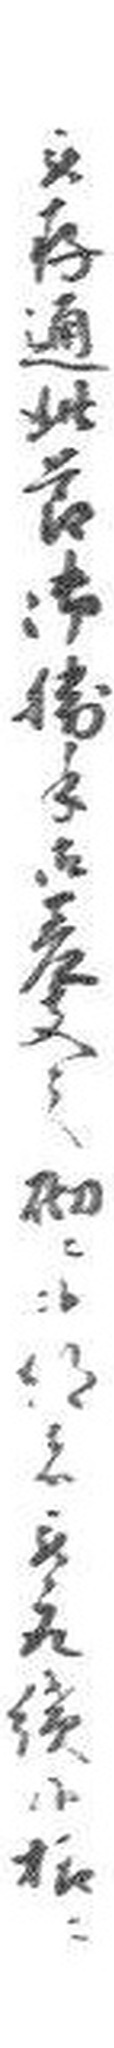被存通此節御勝手御差支之砌ニ候得者被取続候様ニ
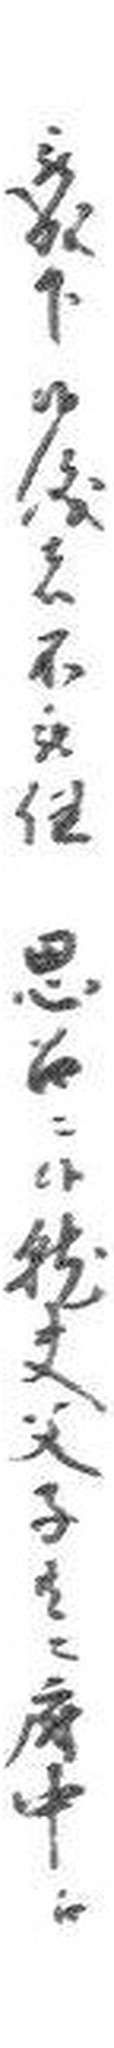被成下候儀者不被任思召ニ候就夫父子共ニ府中江
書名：家譜 二十九 吉邦公 従正徳二年到正徳三年
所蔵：福井県文書館 Fukui Prefectural Archives
